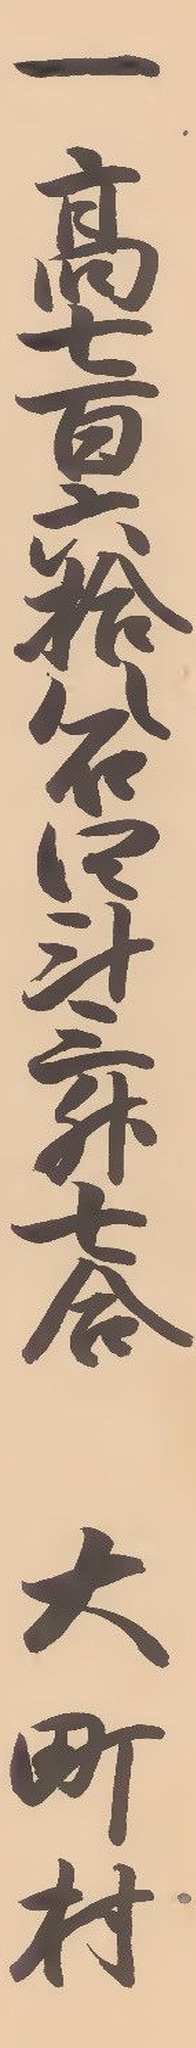一高七百六拾八石四斗三升七合大町村
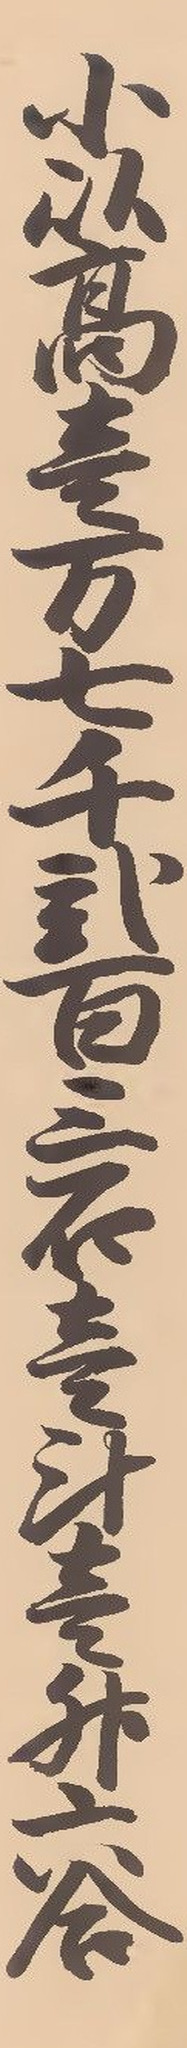小以高壱万七千弐百三石壱斗壱升六合
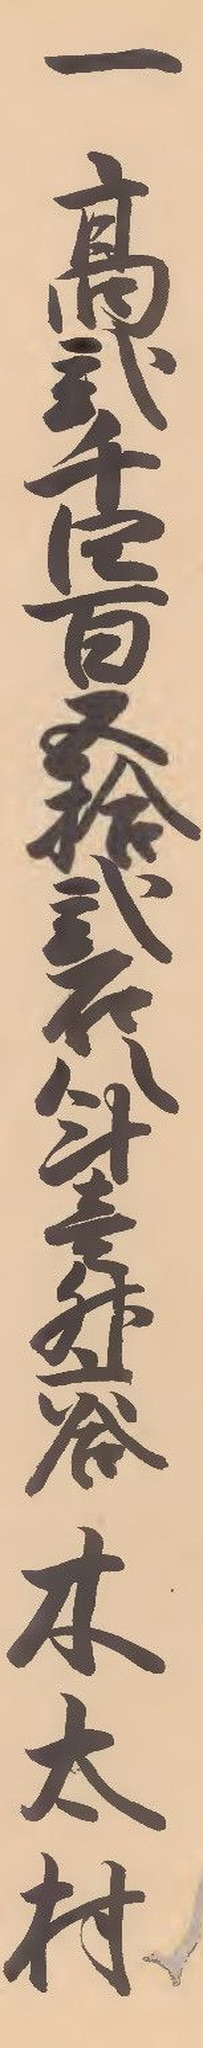一高弐千四百五拾弐石八斗壱升六合木太村
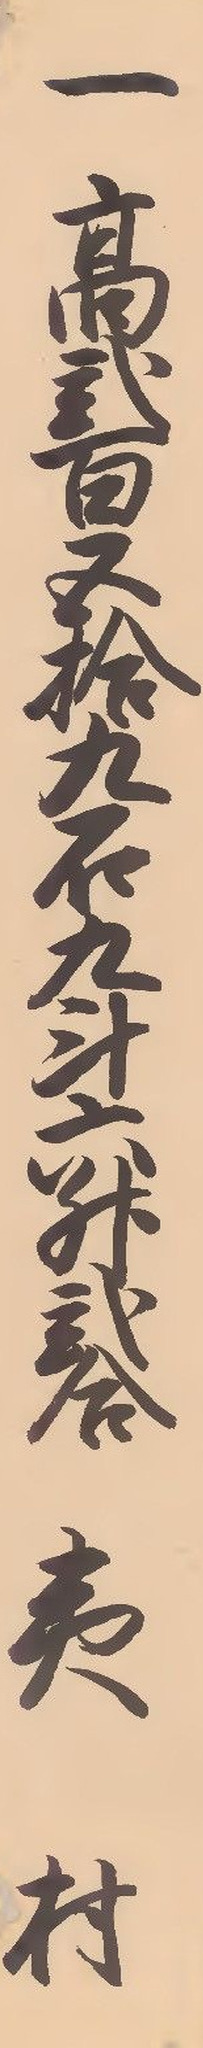一高弐百五拾九石九斗六升弐合夷村
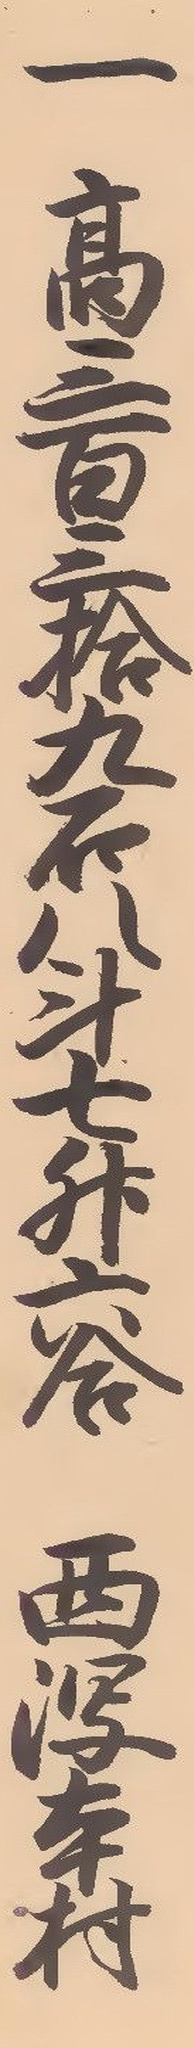一高三百三拾九石八斗七升六合西潟本村

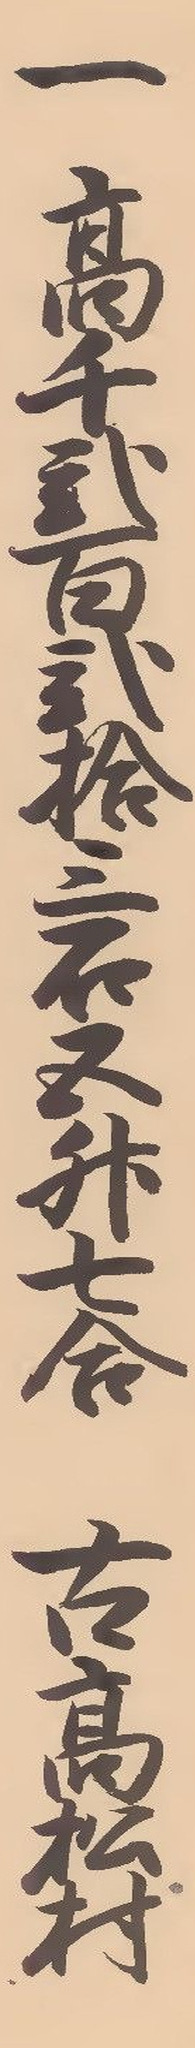一高千弐百弐拾三石五升七合古高松村
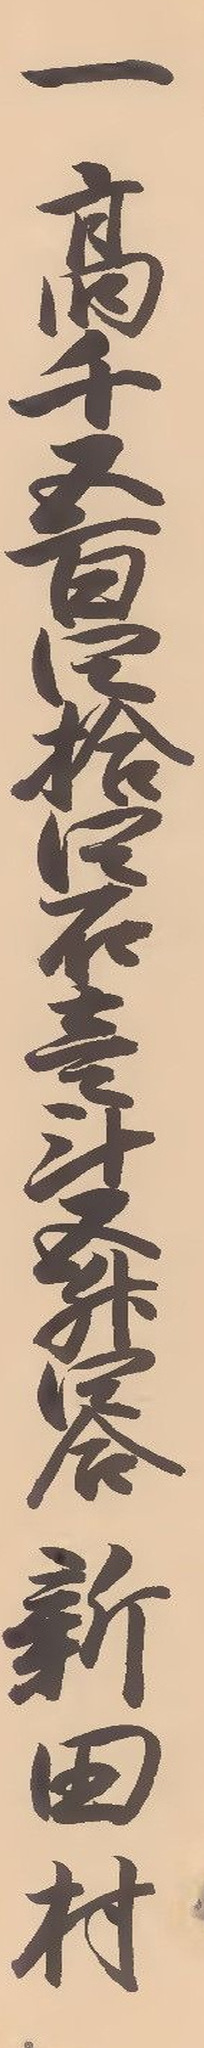一高千五百四拾四石壱斗五升四合新田村
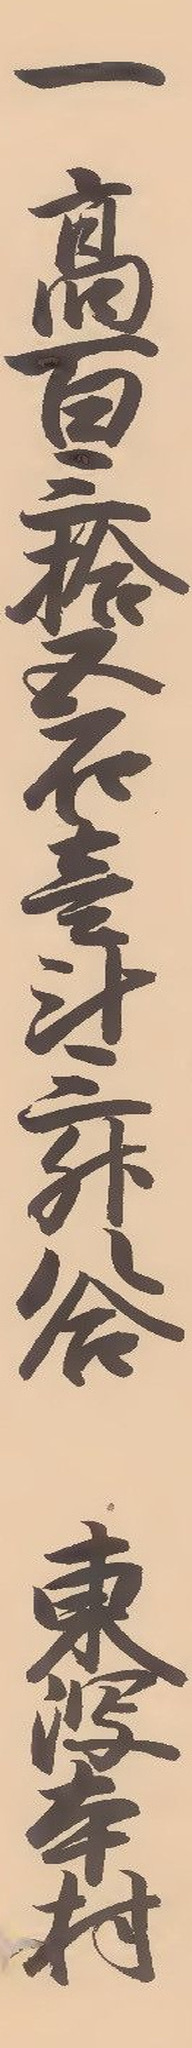一高百三拾五石壱斗三升八合東潟本村
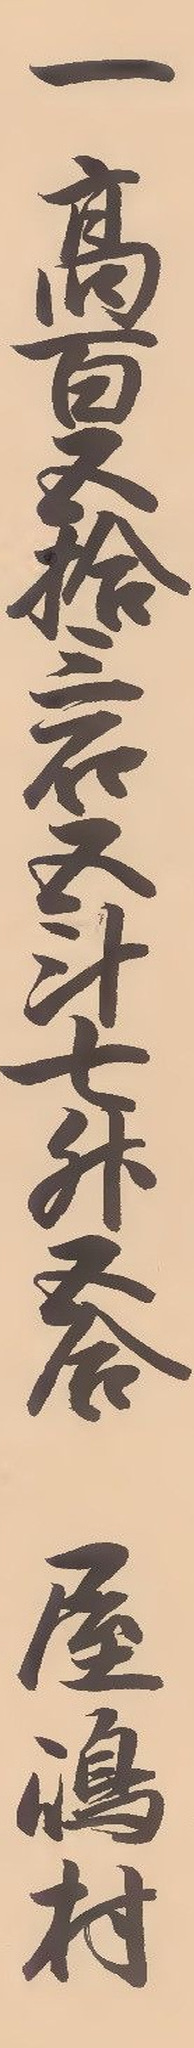一高百五拾三石五斗七升五合屋島村
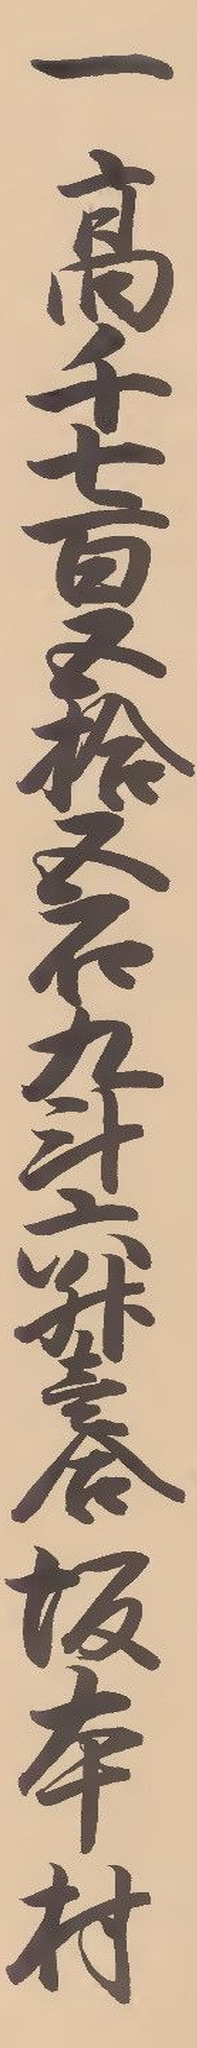一高千七百五拾五石九斗六升壱合坂本村
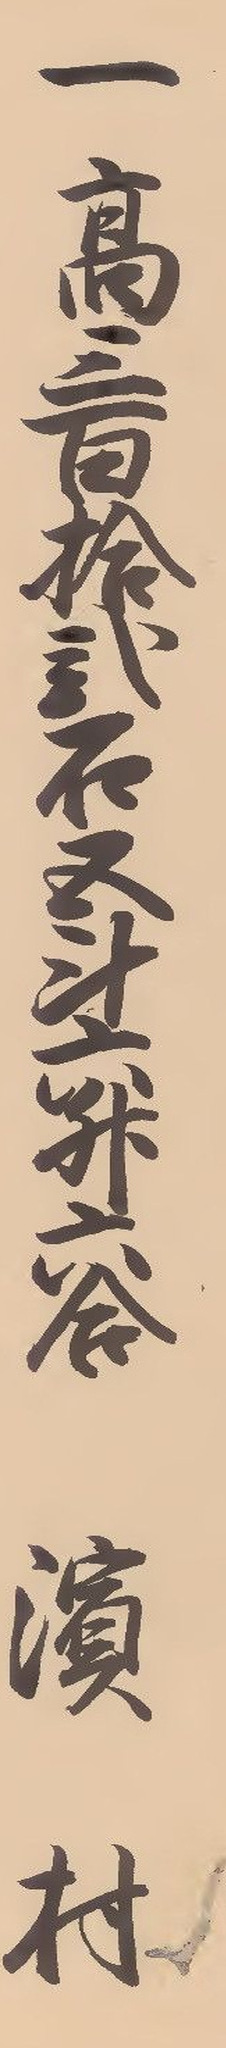一高三百拾弐石五斗六升六合浜村
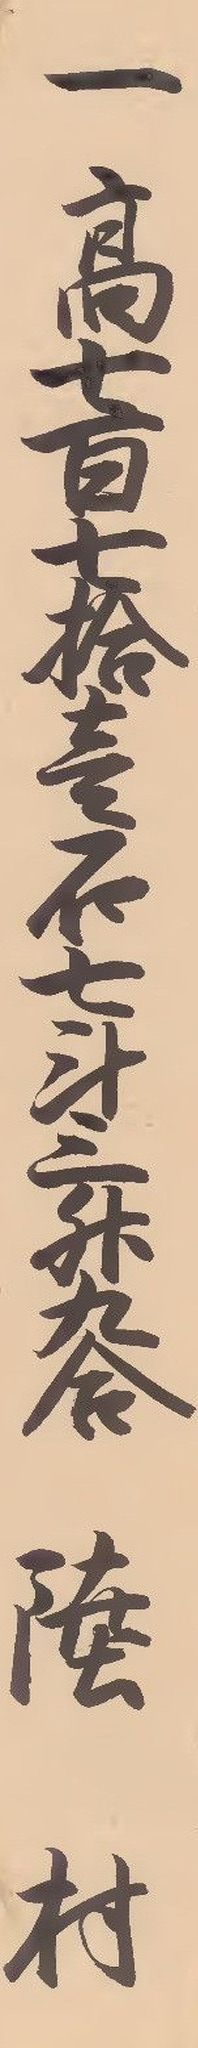一高七百七拾壱石七斗三升九合陸村
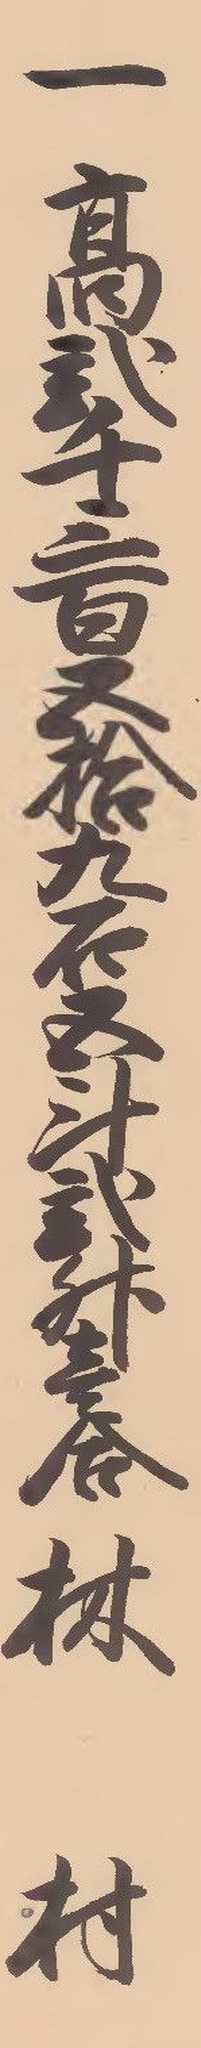一高弐千三百五拾九石五斗弐升壱合林村

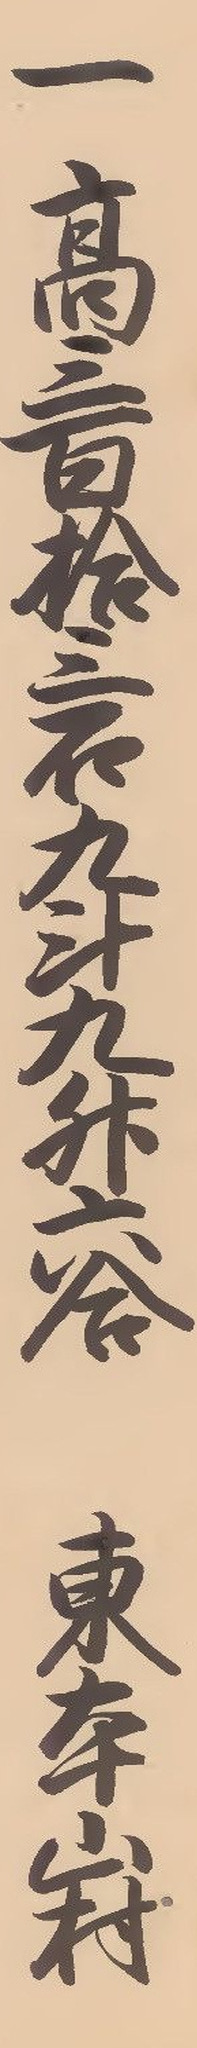一高三百拾三石九斗九升六合東本山村
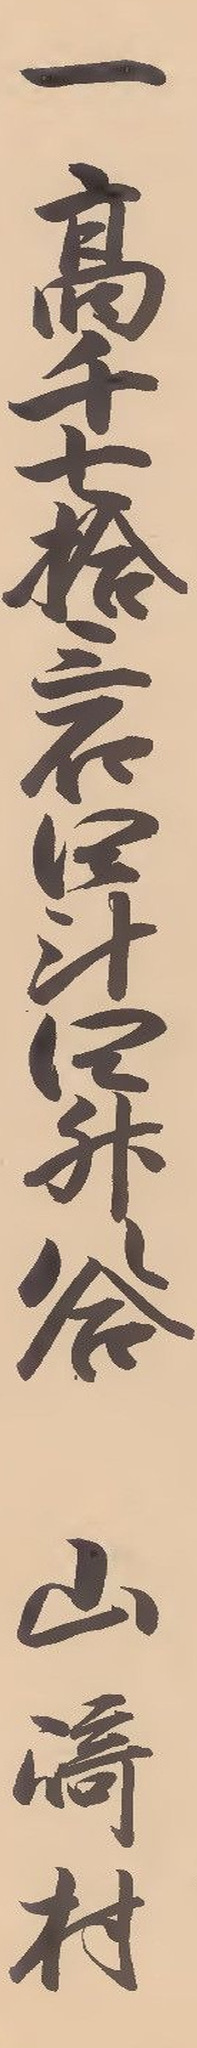一高千七拾三石四斗四升八合山崎村
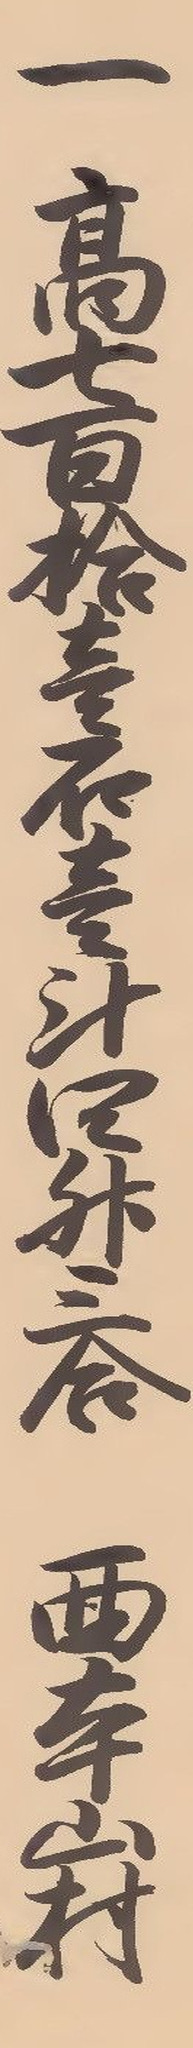一高七百拾壱石壱斗四升三合西本山村
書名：讃岐国郷帳
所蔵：国立公文書館 National Archives of Japan
